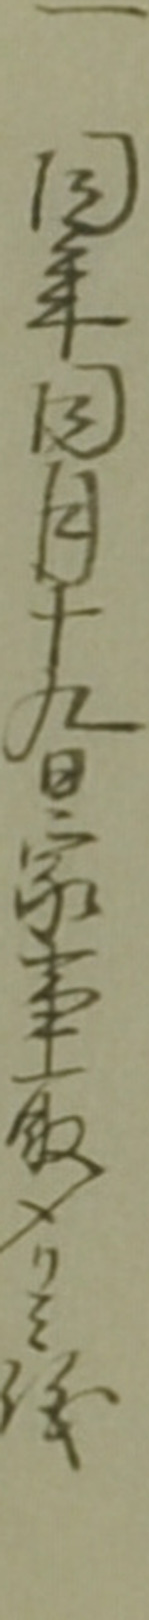一同年同月十九日家事〆リ之儀
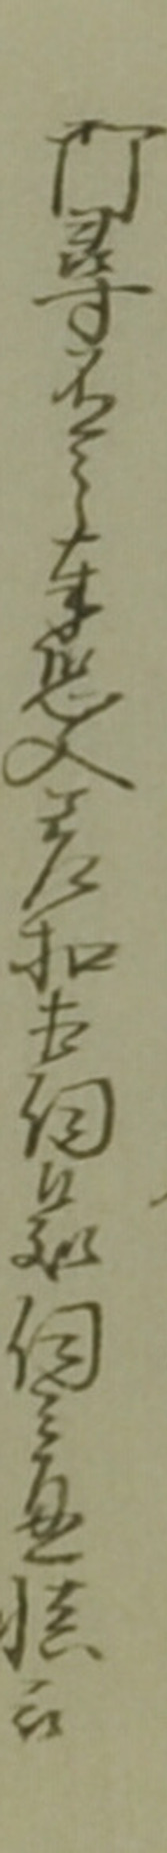御尋有之奉恐入差控相伺候処伺之通慎被
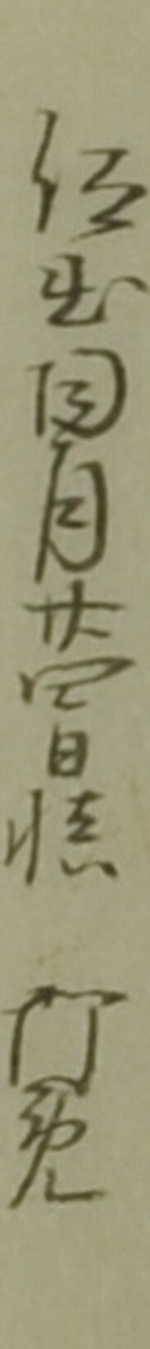仰出同月廿四日慎御免
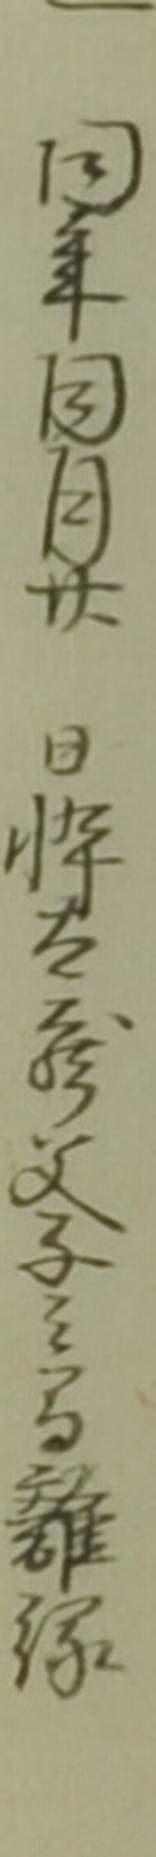一同年同月廿日忰太蔵父子之間離縁
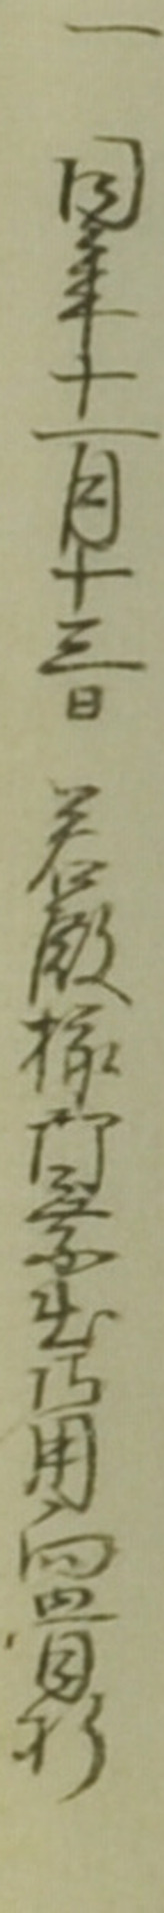一同年十一月十三日若殿様御乗出御用向骨折

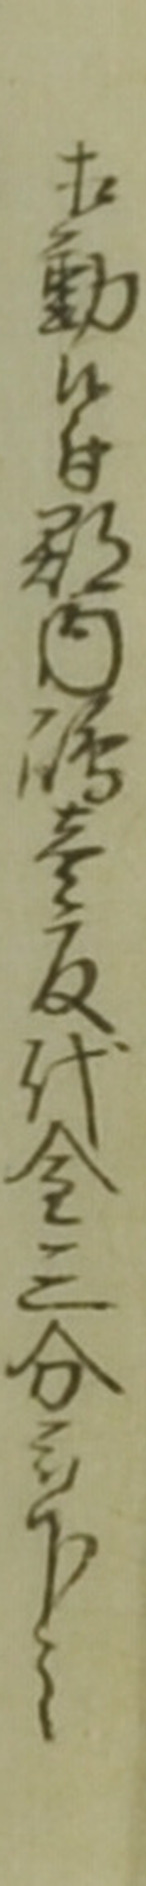相勤候付郡内嶋壱反代金三分被下之
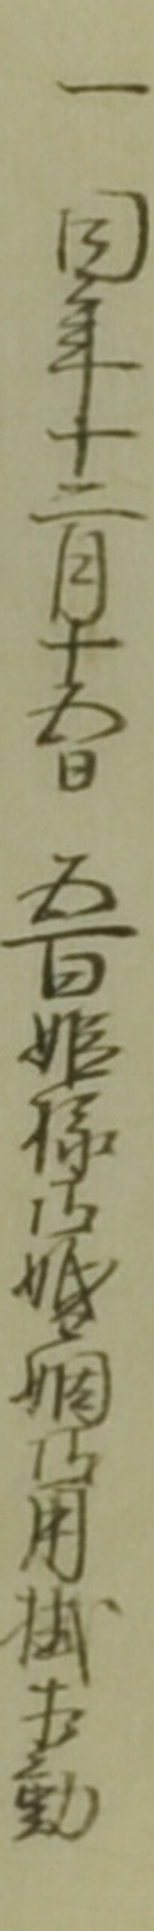一同年十二月十五日五百姫様御婚姻御用掛相勤
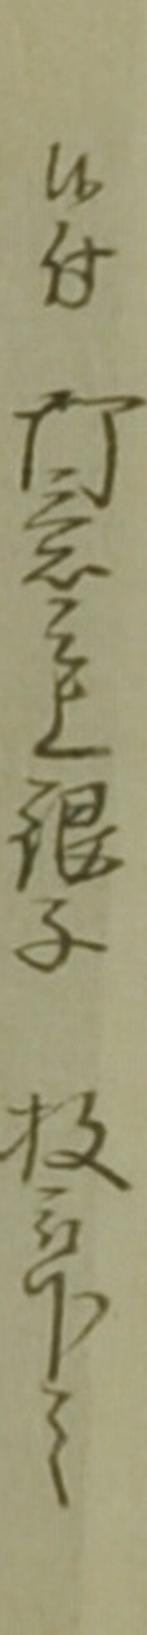候付御意之通銀子枚被下之
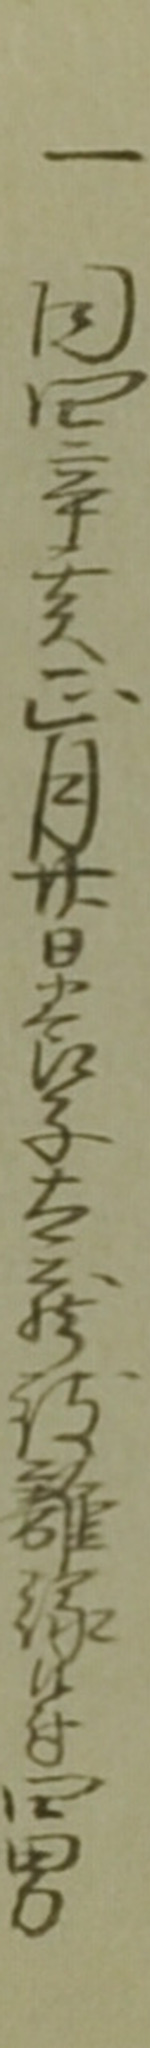一同四辛亥正月廿日養子太蔵致離縁候付四男
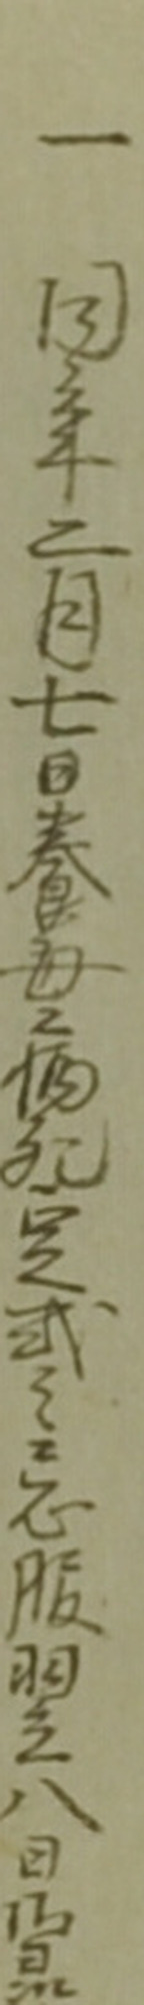一同年二月七日養母病死定式之忌服翌八日御尋
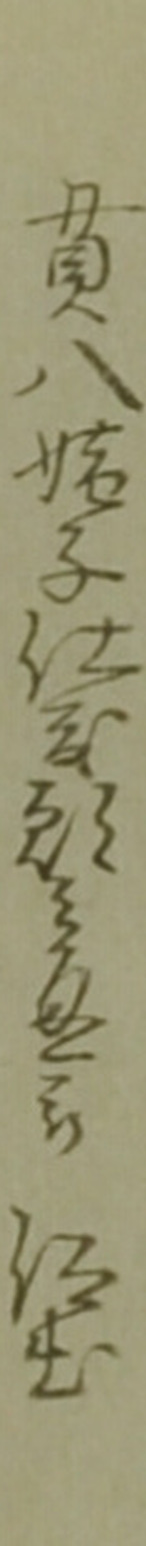貫八嫡子仕度願之通被仰出
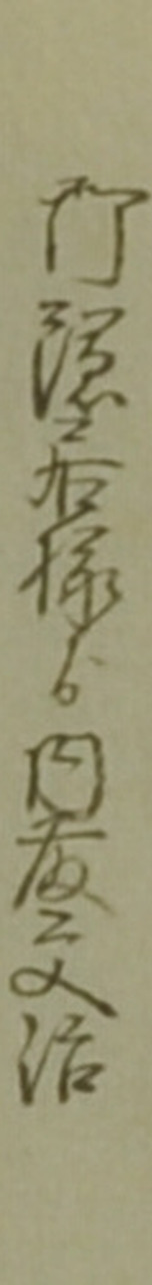御隠居様ゟ内藤文治
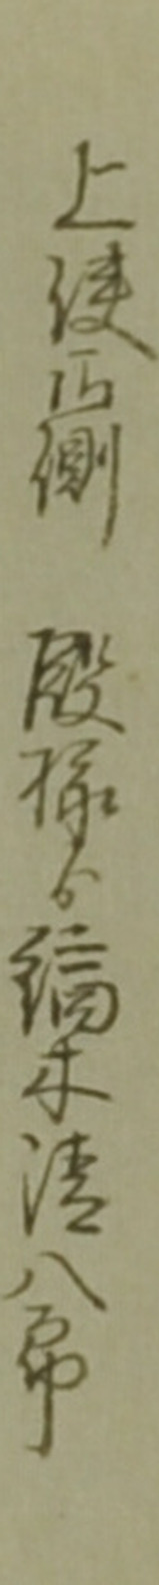上使御側殿様ゟ鏑木清八郎
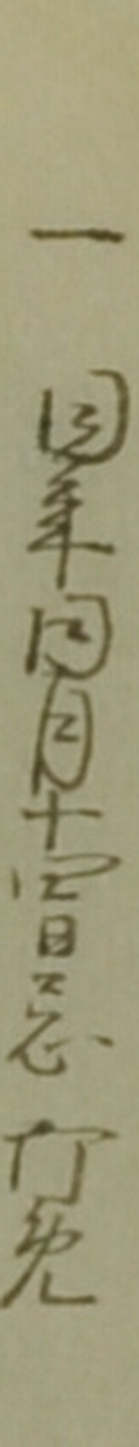一同年同月十四日忌御免
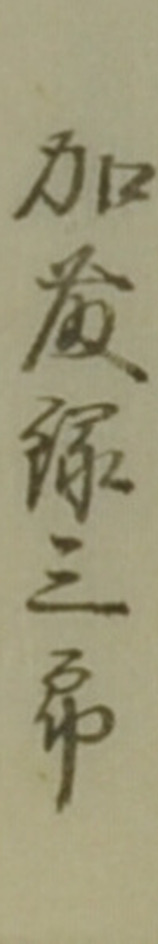加藤録三郎
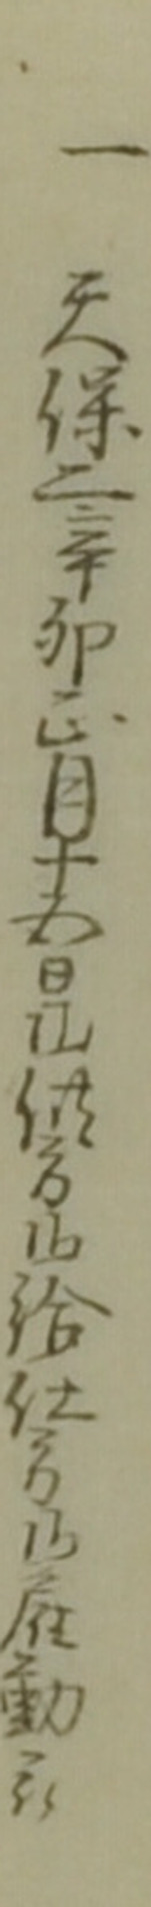一天保二辛卯正月十五日御供方御給仕方御雇勤被
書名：給人諸士勤仕録（三）
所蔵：伊那市立高遠町図書館・合同会社AMANE
